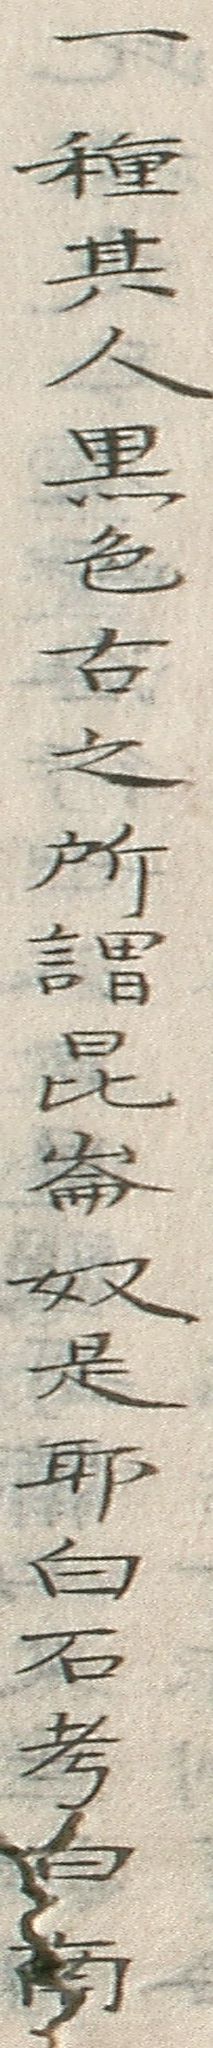一種其人黒色古之所謂崑崙奴是耶白石考曰南
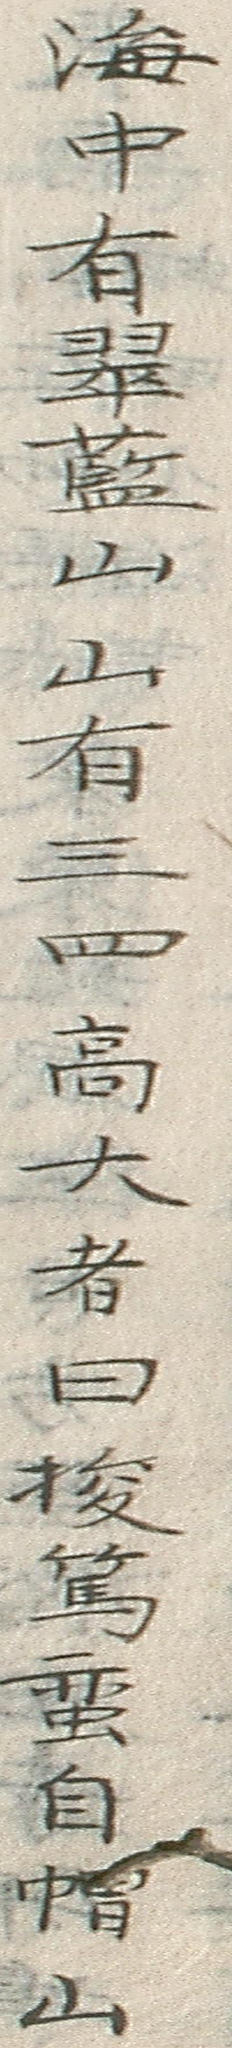海中有翠藍山山有三四高大者曰埈篤蛮自帽山

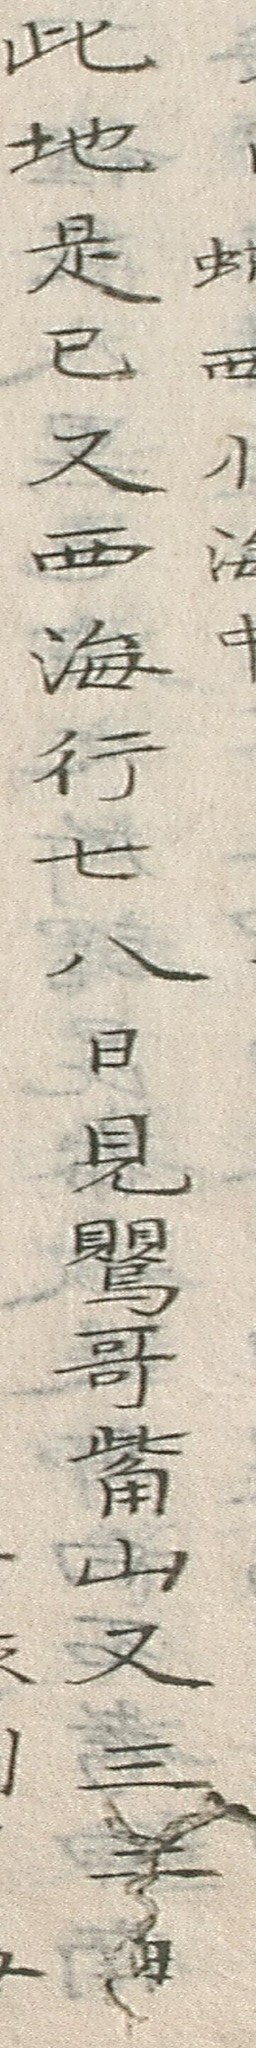此地是巳又西海行七八日見鸎哥觜山又三二日
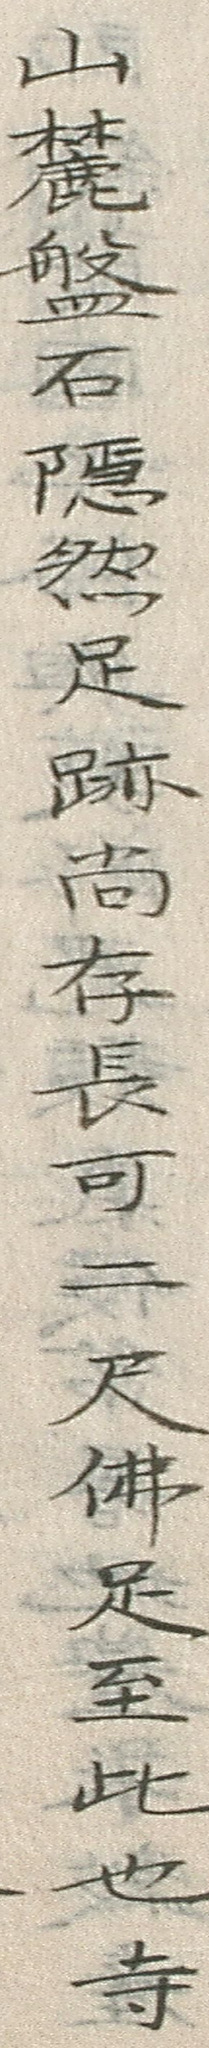山麓盤石隠然足跡尚存長可二尺仏足至此也寺
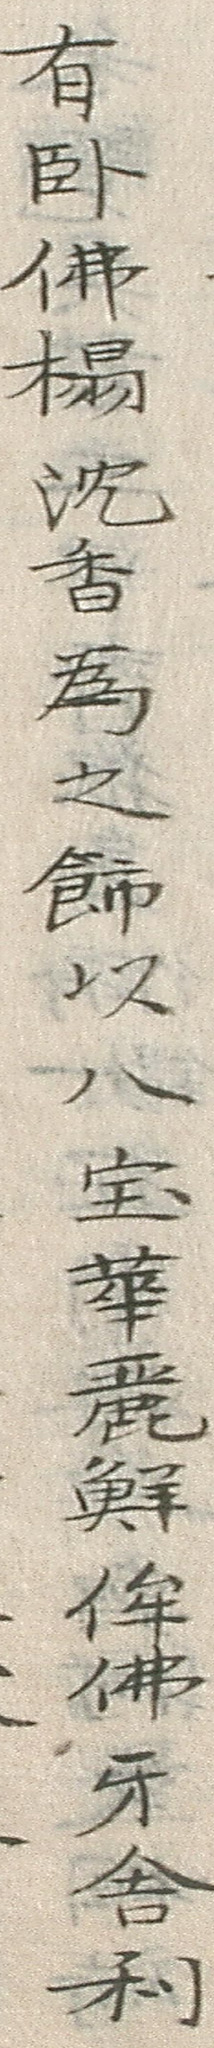有臥仏楊沈香為之飾以八宝華麗鮮侔仏牙舎利
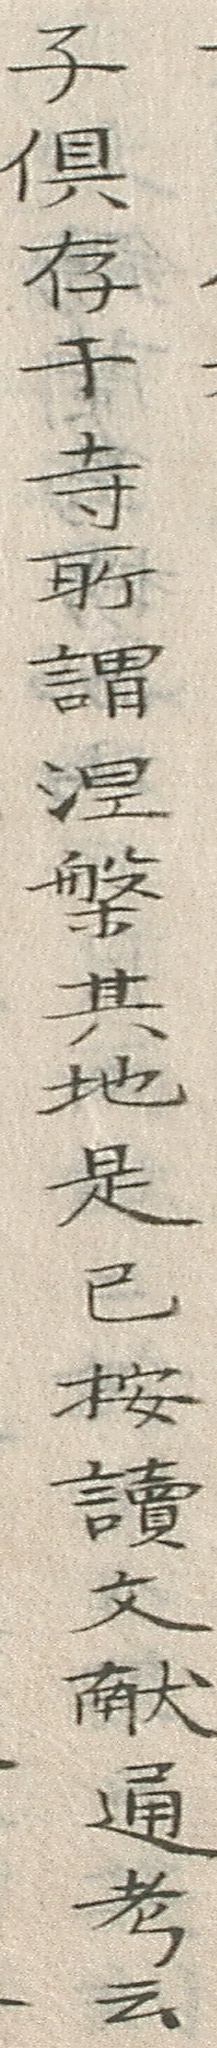子俱存于寺所謂涅槃其地是已按読文献通考云
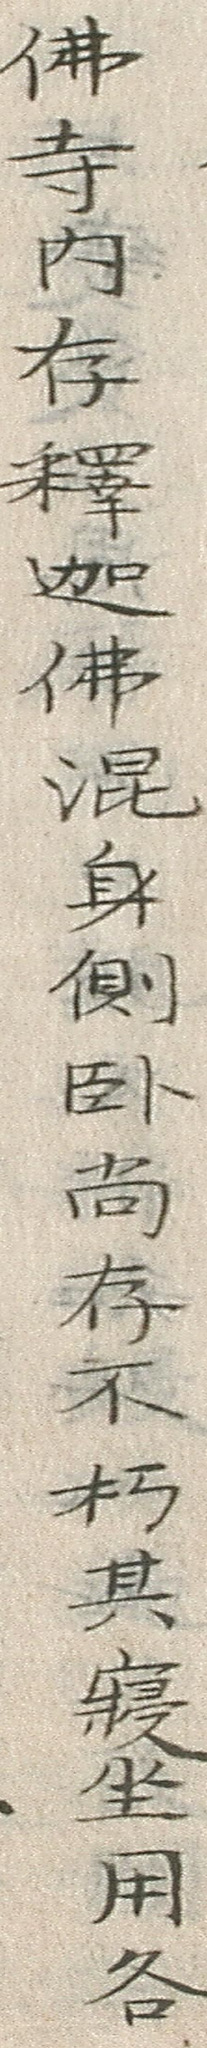仏寺内存釈迦仏混身側臥尚存不朽其寝坐用各
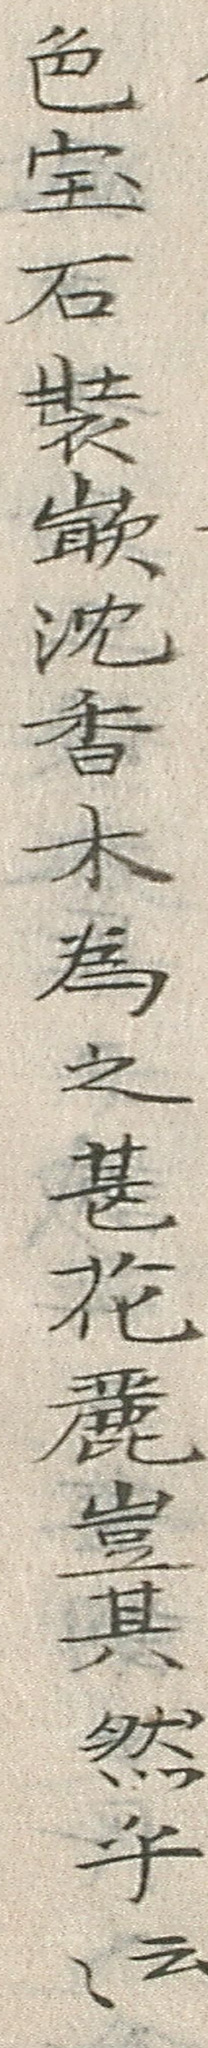色宝石装飾沈香木為之甚花麗豈其然乎云〻
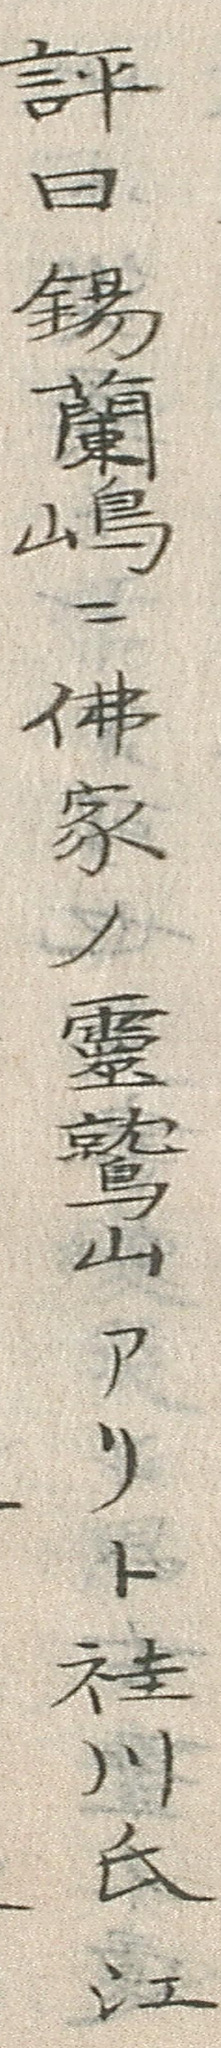評曰錫蘭嶋ニ仏家ノ霊鷲山アリト桂川氏江
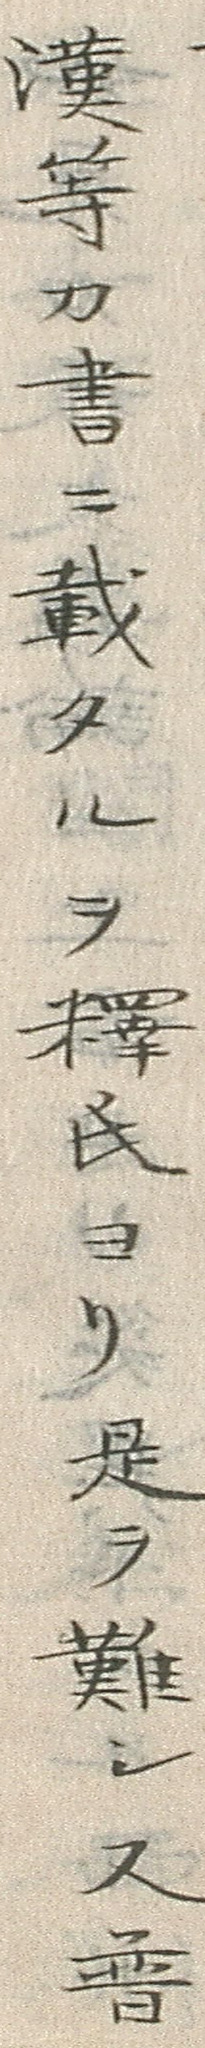漢等カ書ニ載タルヲ釈氏ヨリ是ヲ難シ又普
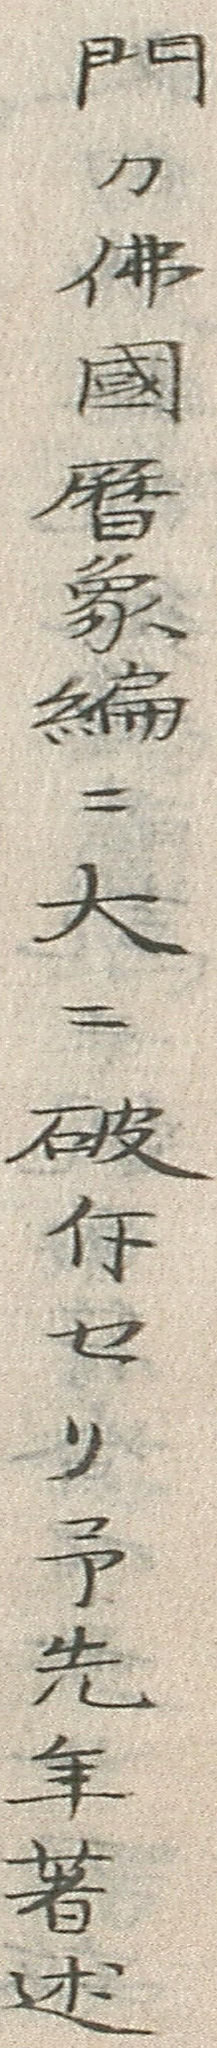門カ仏国暦象編ニ大ニ破仠セリ予先年著述
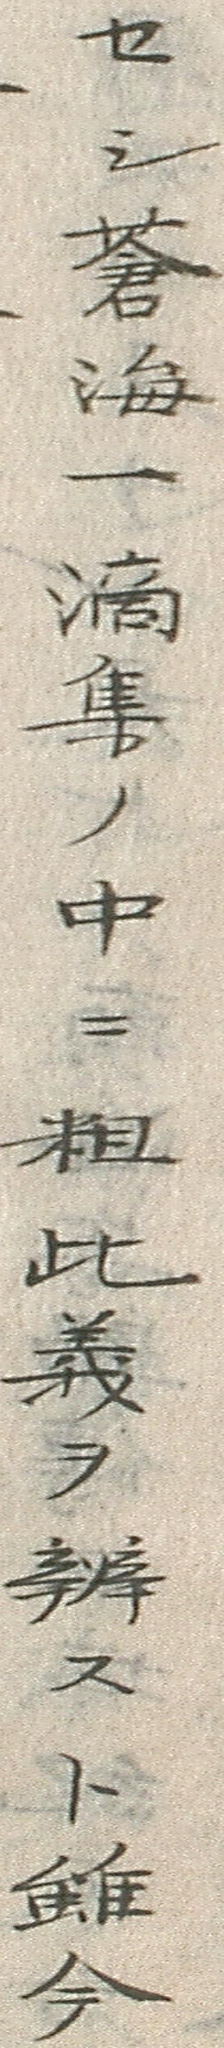セシ蒼海一滴集ノ中ニ粗此義ヲ弁スト雖今
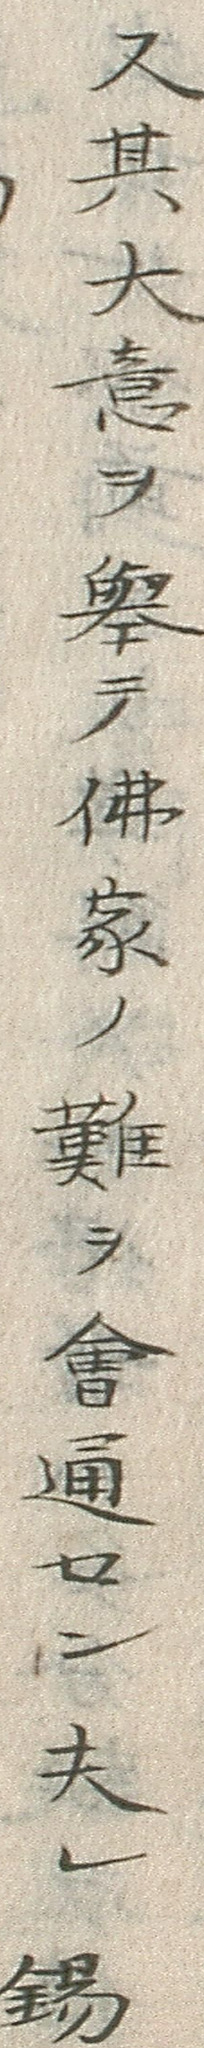又其大意ヲ挙テ仏家ノ難ヲ会通セン夫レ錫
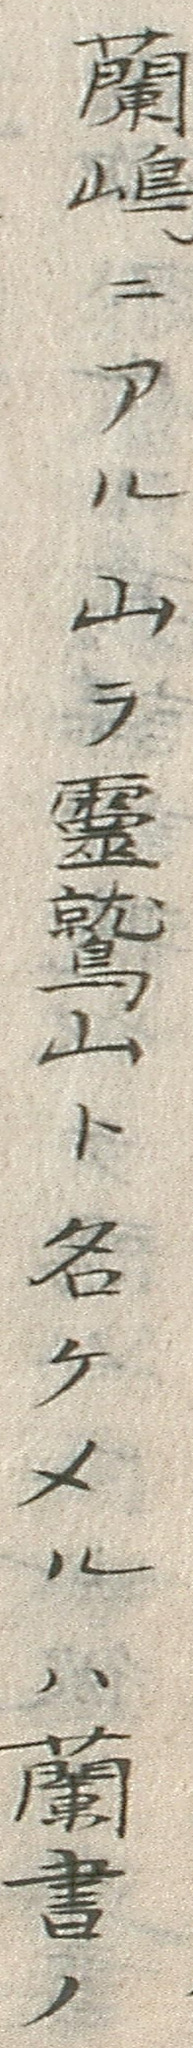蘭嶋ニアル山ヲ霊鷲山ト名ケシメルハ蘭書ノ
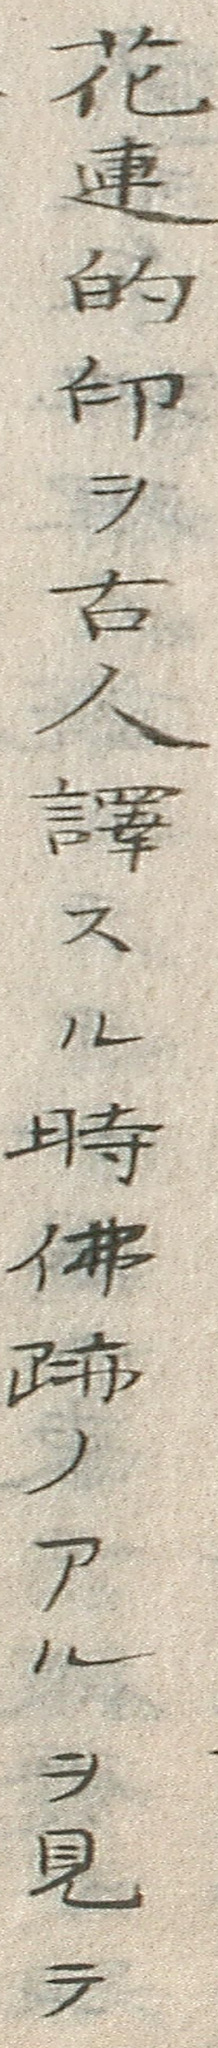花連的印ヲ古人訳スル時仏跡ノアルヲ見テ
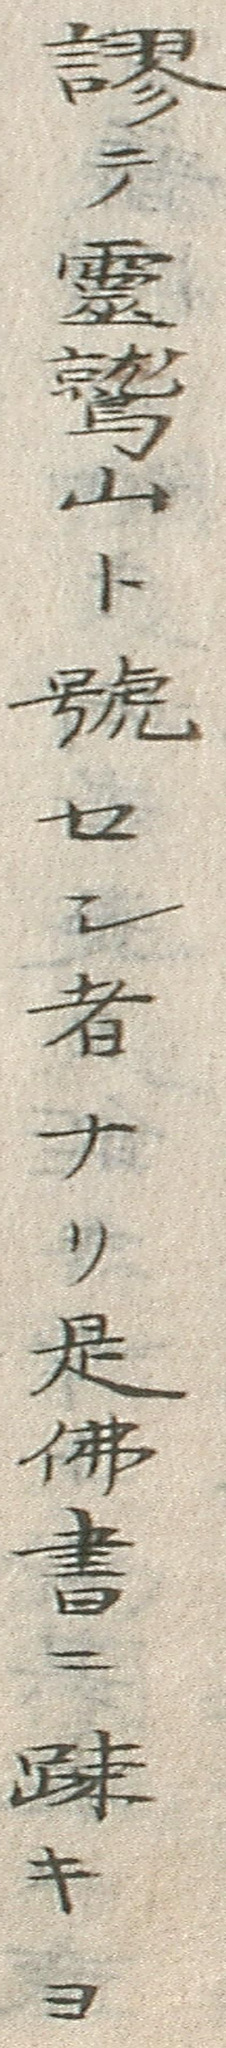謬テ霊鷲山ト号セシ者ナリ是仏書ニ疎キヨ
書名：天學略名目羽翼　全
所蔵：東京大学地震研究所図書室 Earthquake Research Institute Library, The University of Tokyo, JAPAN
